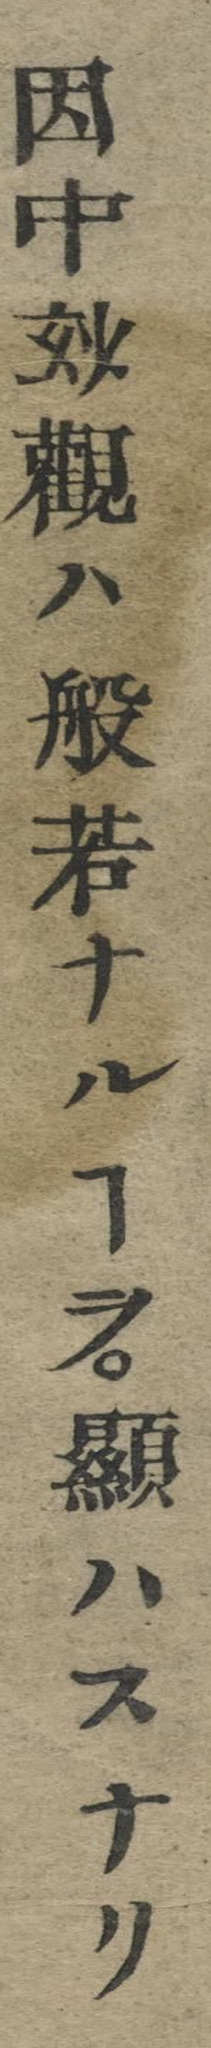因中玅観ハ般若ナルコトヲ。顕ハスナリ
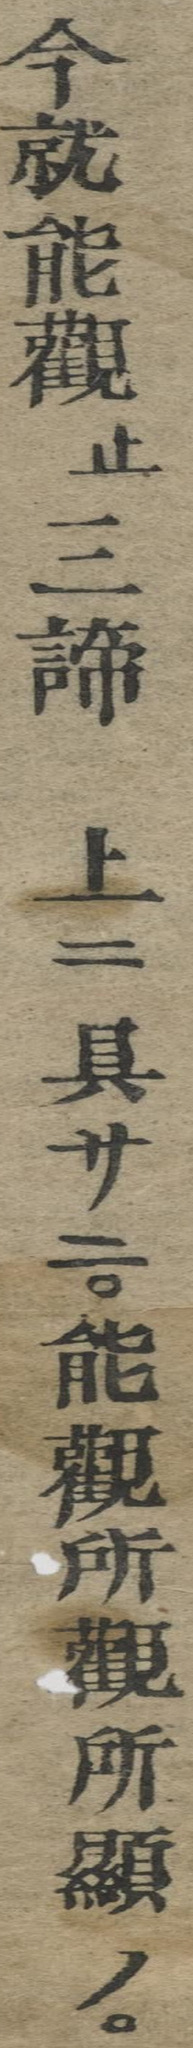今就能観止三諦上ニ具サニ。能観所観所顕ノ。
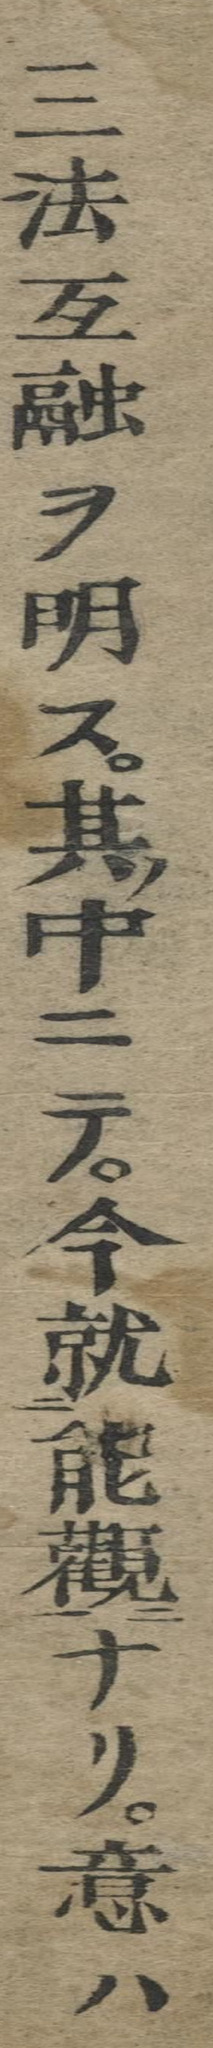三法互融ヲ明ス。其中ニテ。今就ニ能観。意ハ
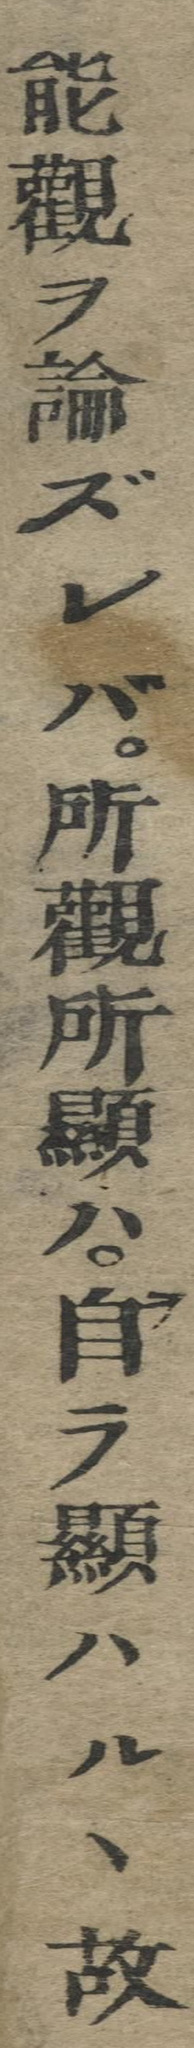能観ヲ論ズレバ。所観所顕ハ。自ラ顕ハルヽ故

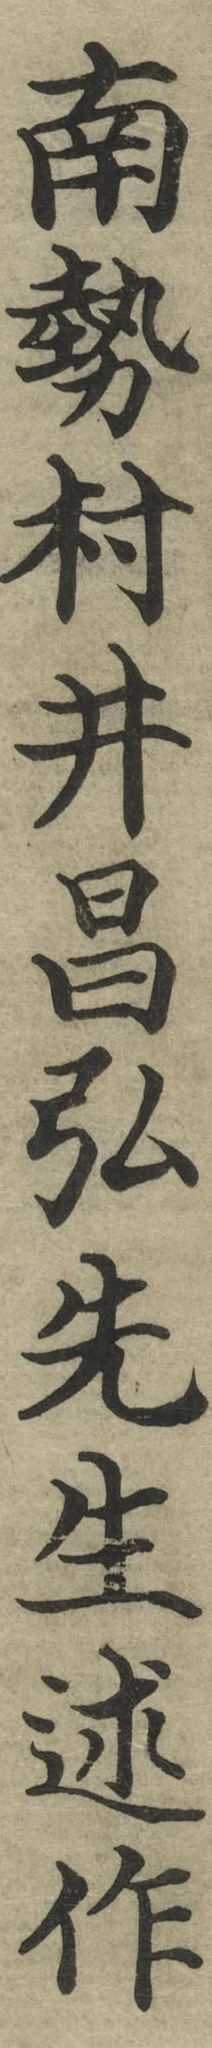南勢村井昌弘先生述作
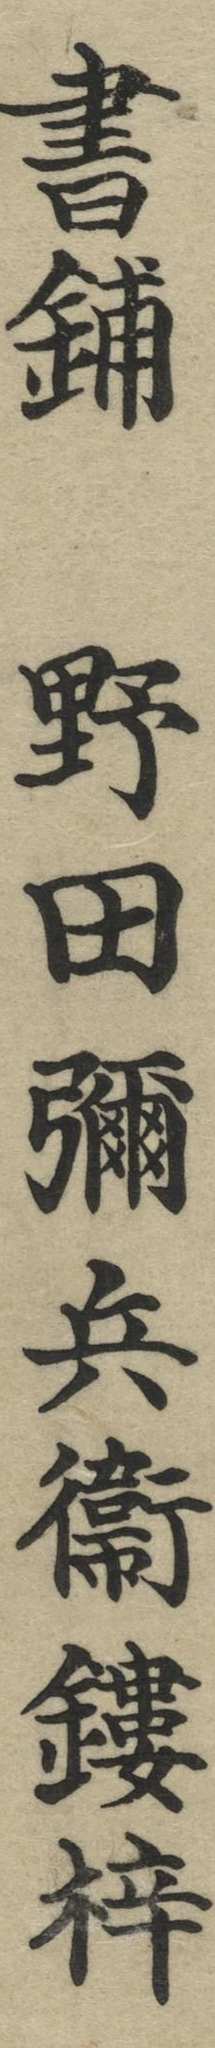書鋪野田彌兵衞鏤梓
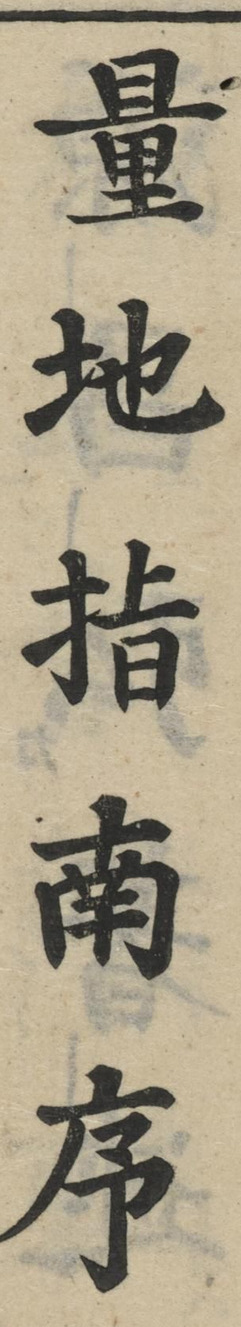量地指南序

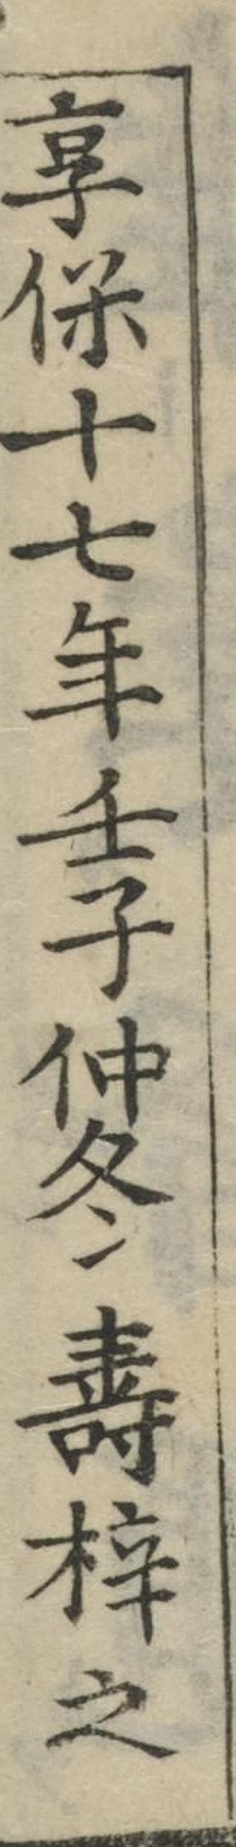享保十七年壬子仲冬寿梓之
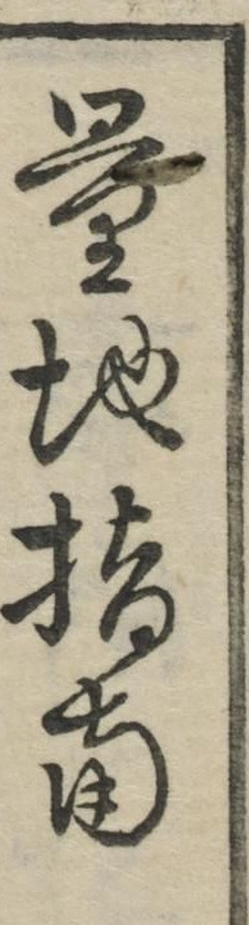量地指南
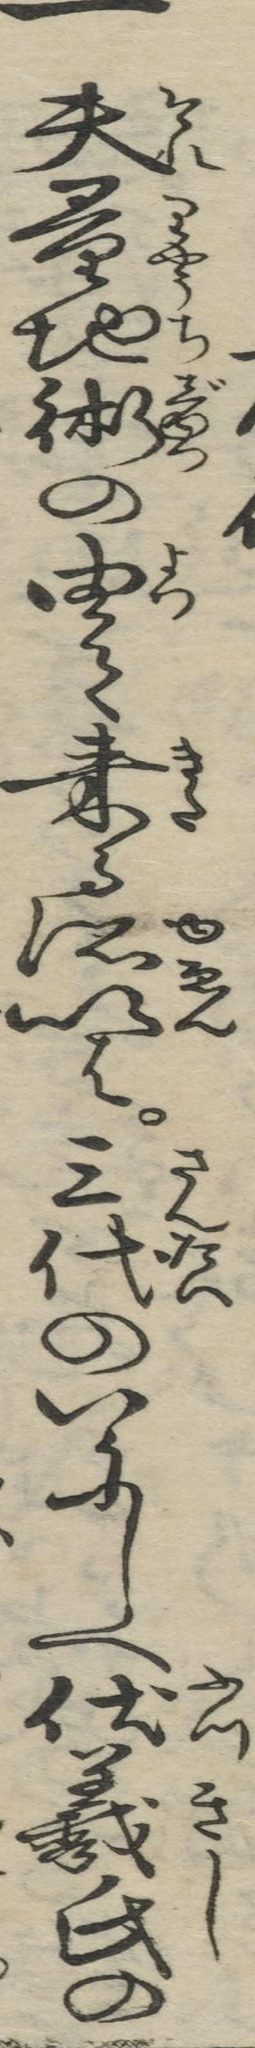一夫量地術の由て来る所以は。三代のいにしへ伏羲氏の
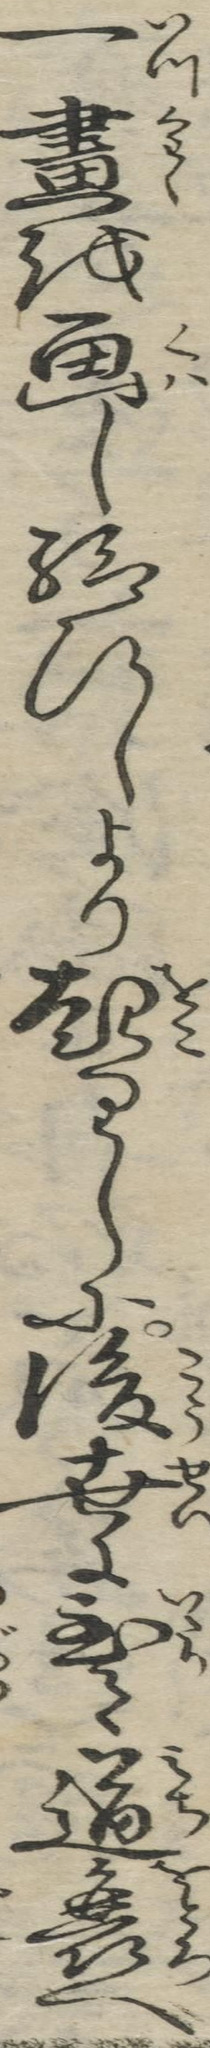一画を画し給ひしより起りしに。後世に至て道衰へ
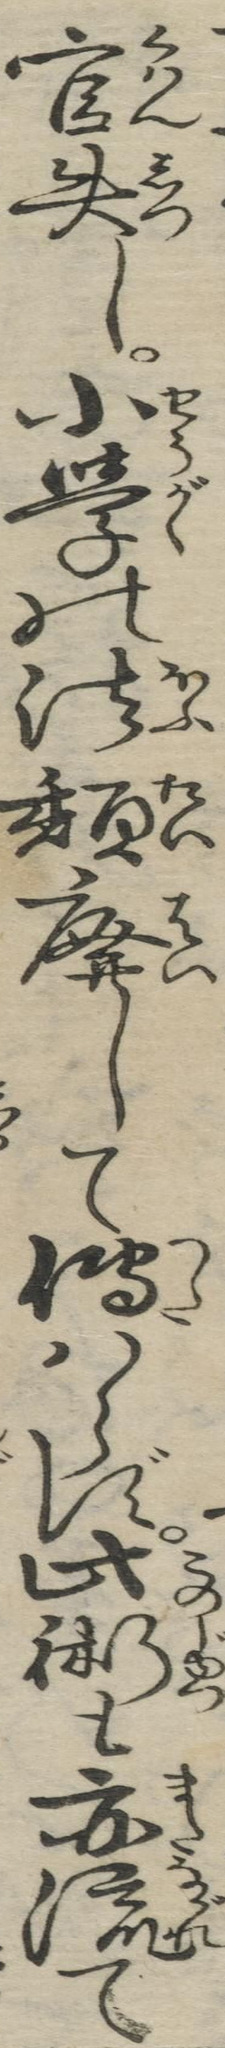官失し。小学の法頽廃して伝はらず。此術も亦流て
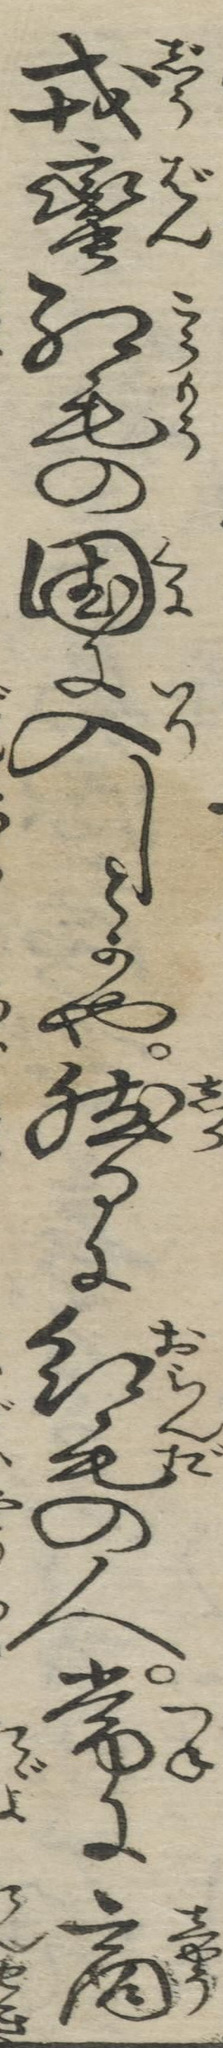戎蛮紅毛の国に入しとかや。然るに紅毛の人。常に商
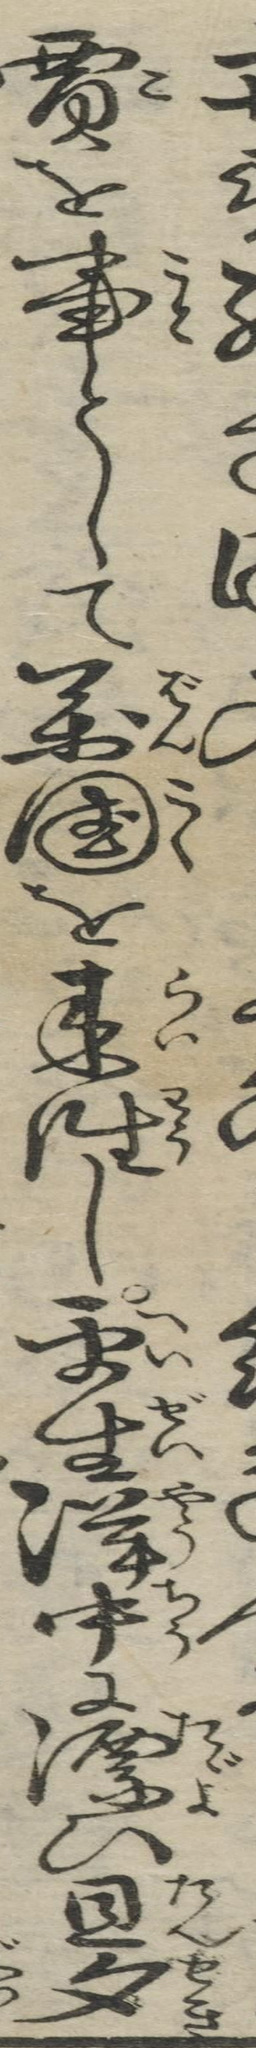賈を事として蛮国を来往し平生洋中に漂い旦夕
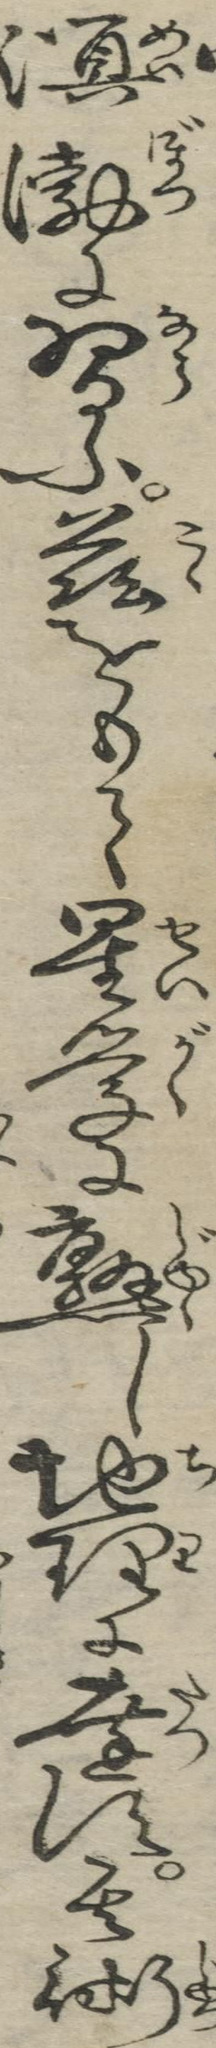溟渤に習ふ。茲をもて星学に熟し地理に達す。其術
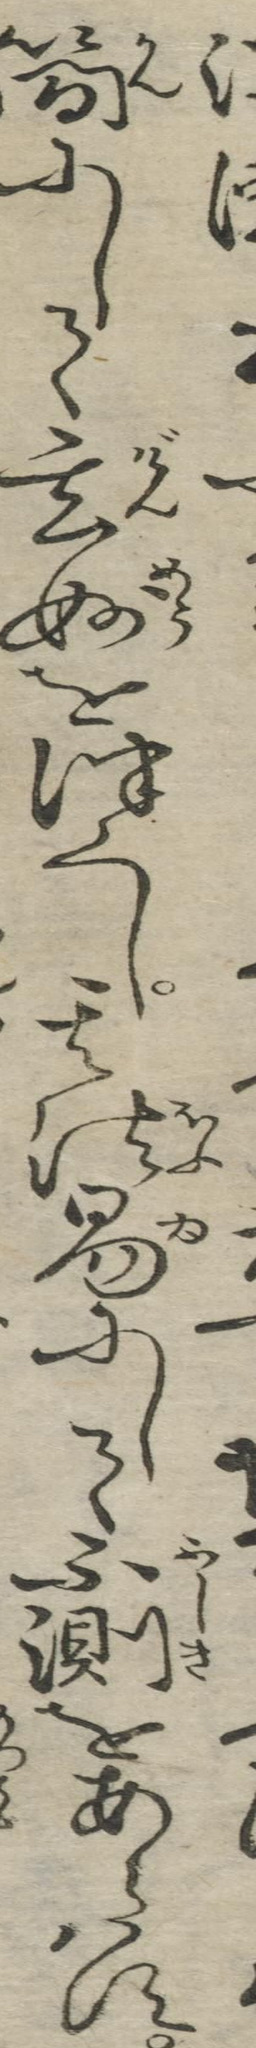簡にして玄妙をつくし。其法易にして不測をあらはす。
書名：量地指南　巻之一（内題）
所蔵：東京大学地震研究所図書室 Earthquake Research Institute Library, The University of Tokyo, JAPAN
